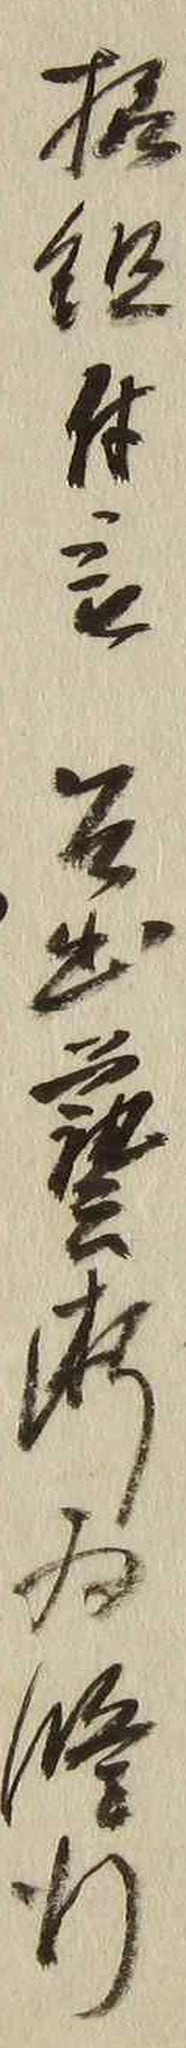様組付被召出芸術為修行
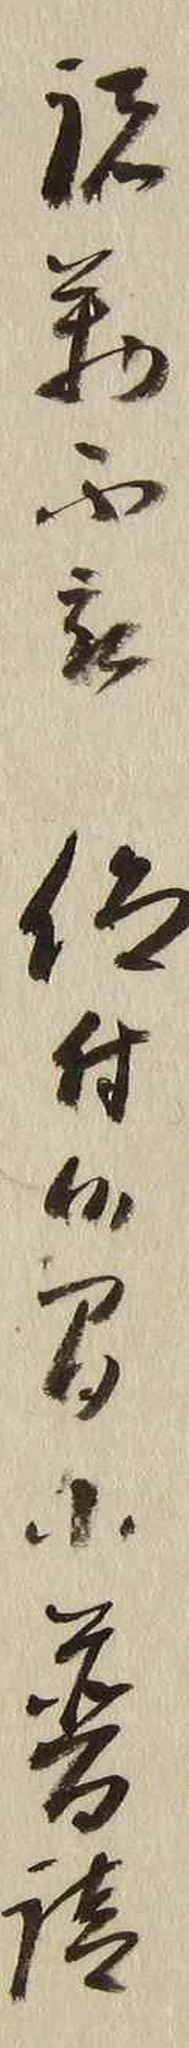諸勤不被仰付候間小普請
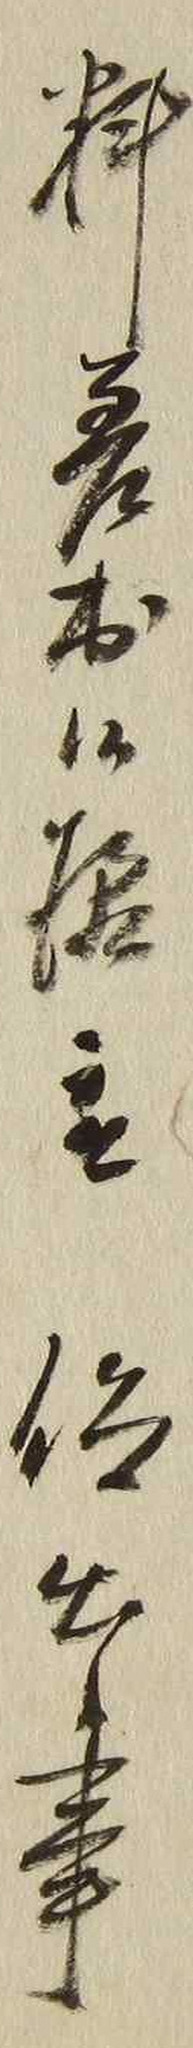料差出候様被仰付候事
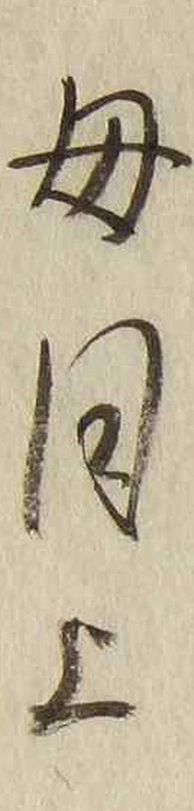母同上

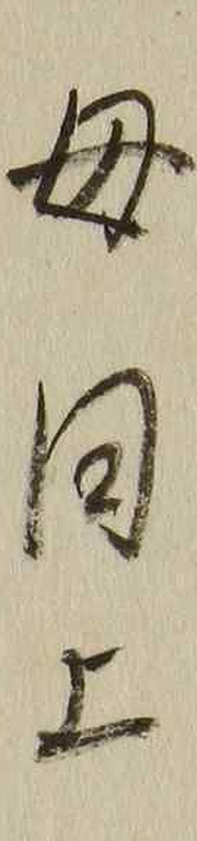母同上
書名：諸士系譜　巻之359　す之部9
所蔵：会津若松市立会津図書館
